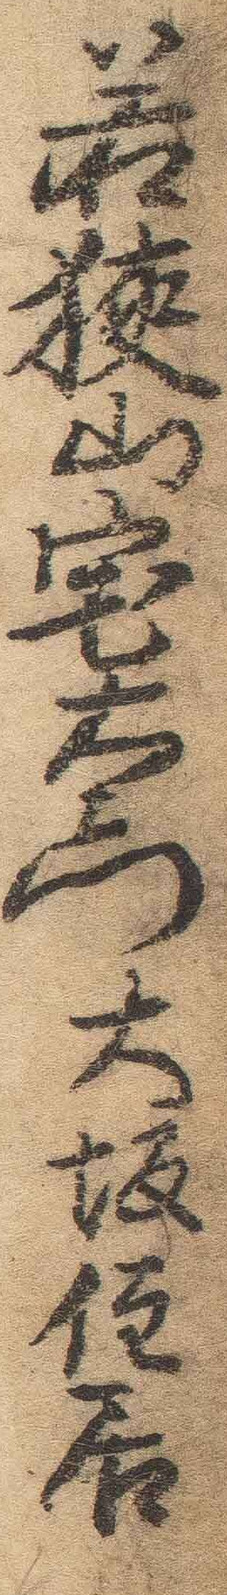若狭山宅右衛門大坂住居
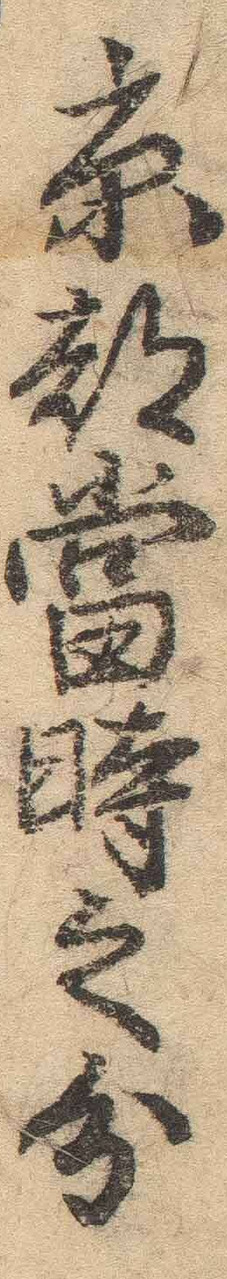京都当時之分
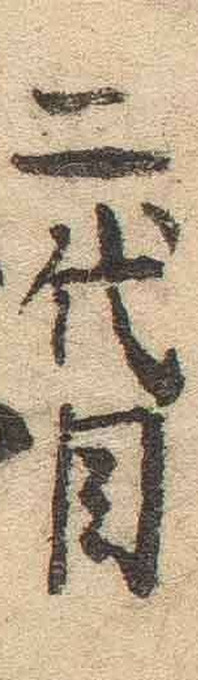二代目
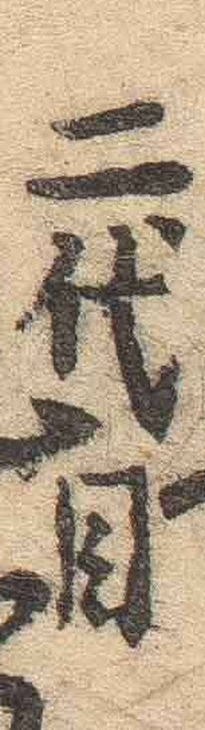二代目
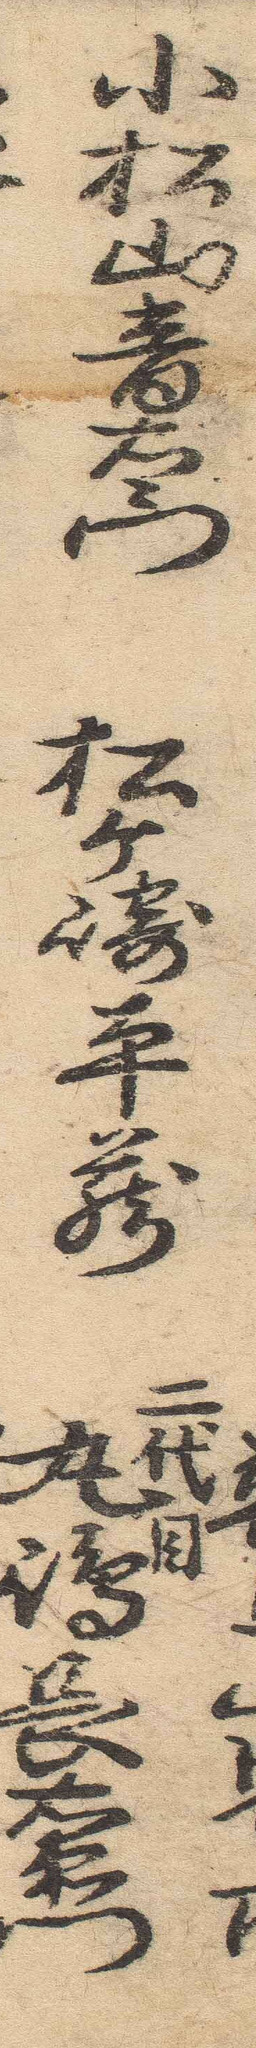小松山音右衛門松ケ崎平蔵丸嶋長右衛門
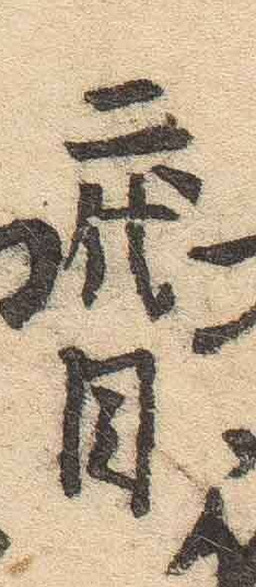二代目
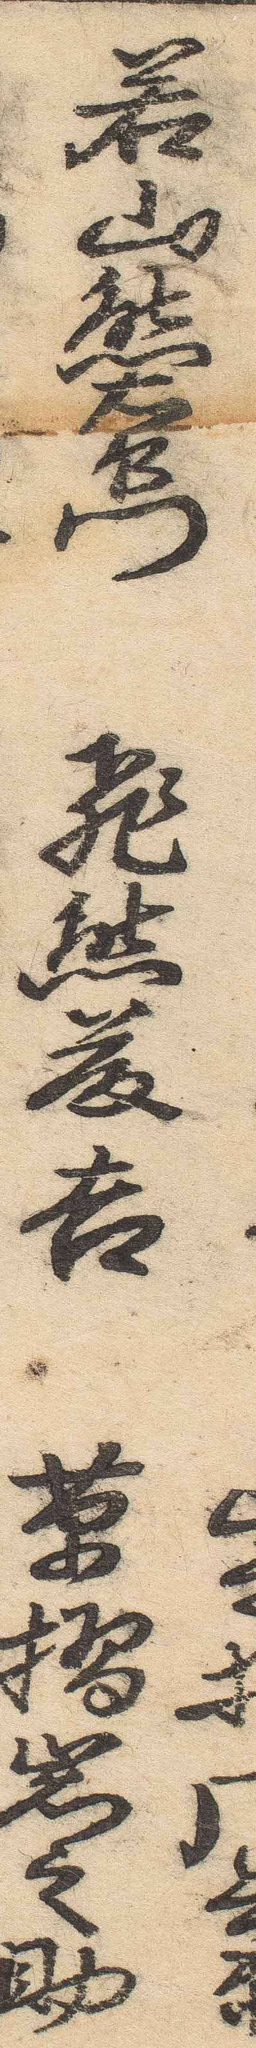若山熊右衛門飛熊藤吉草摺岩之助
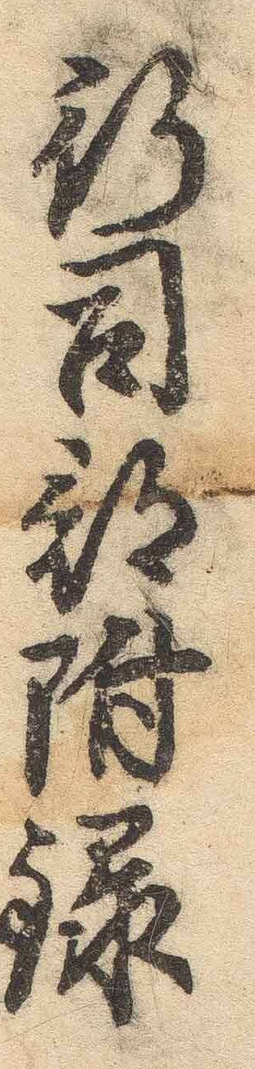行司部附録
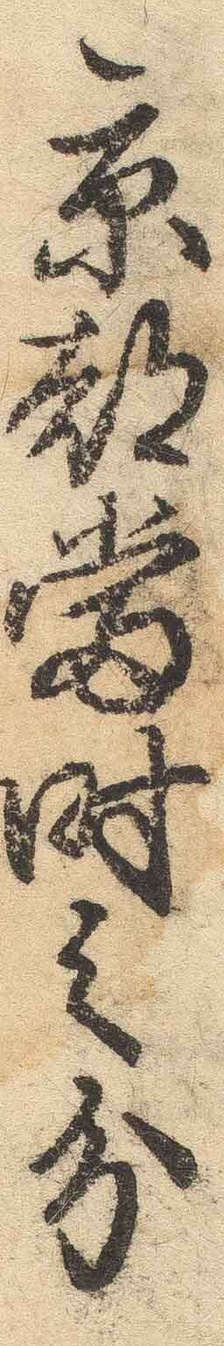京都当時之分
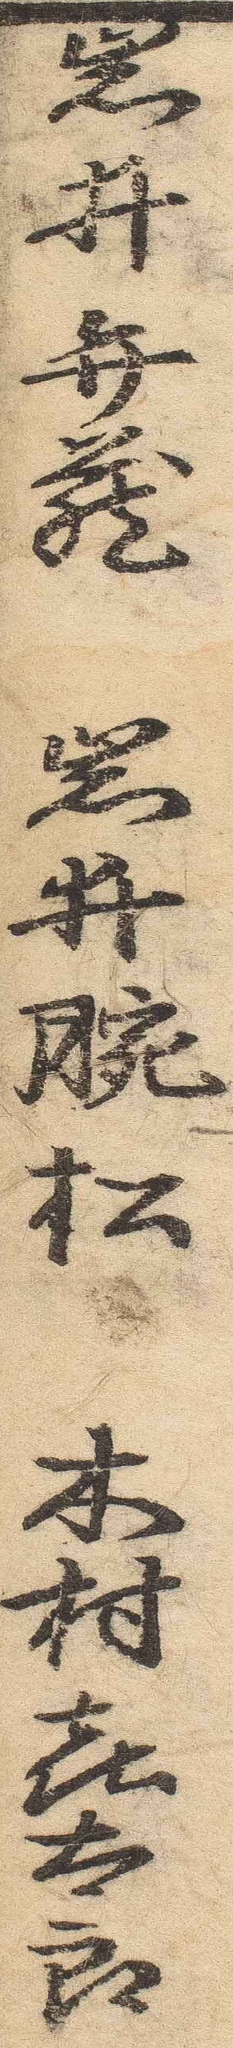岩井弁蔵岩井腕松木村喜太郎
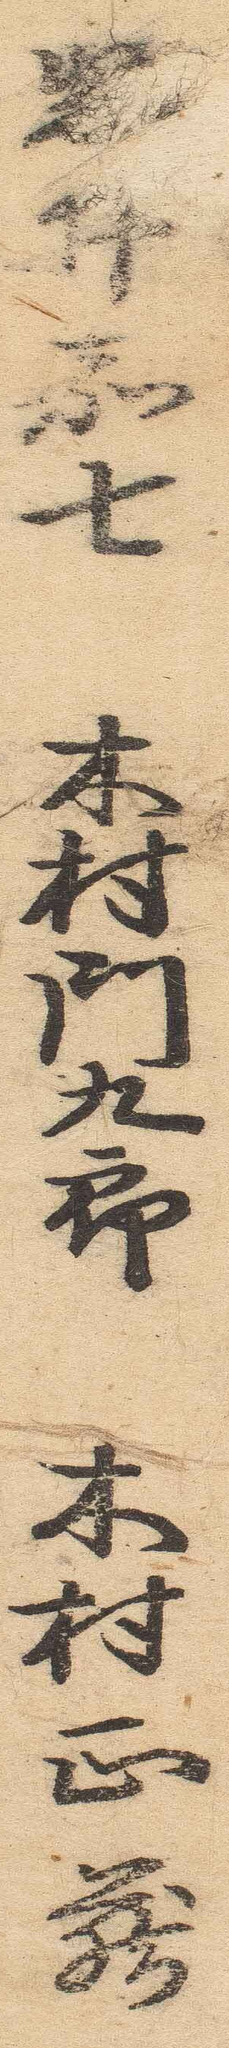岩井嘉七木村門九郎木村正蔵
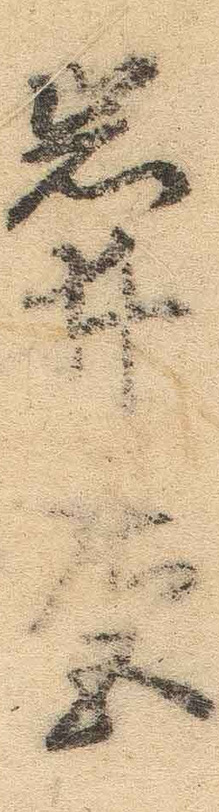岩井庄五
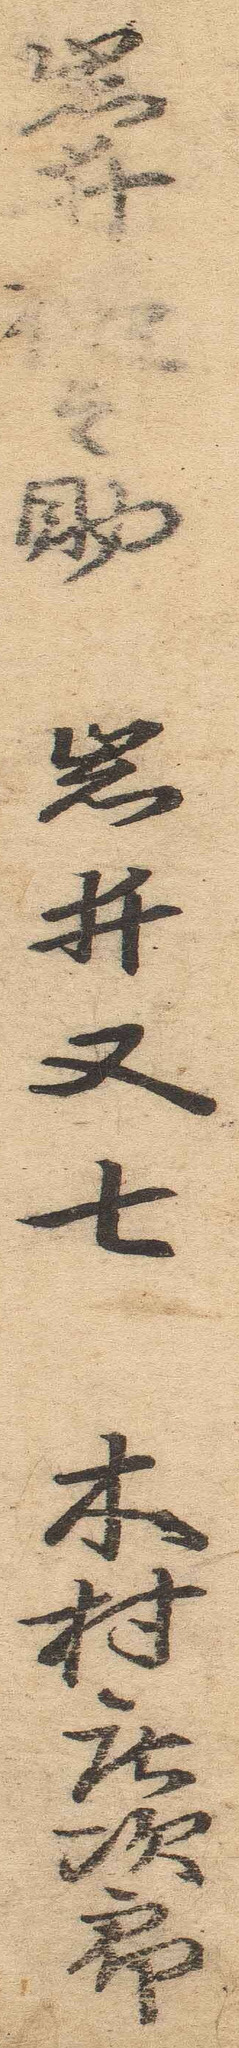岩井之助岩井又七木村庄次郎
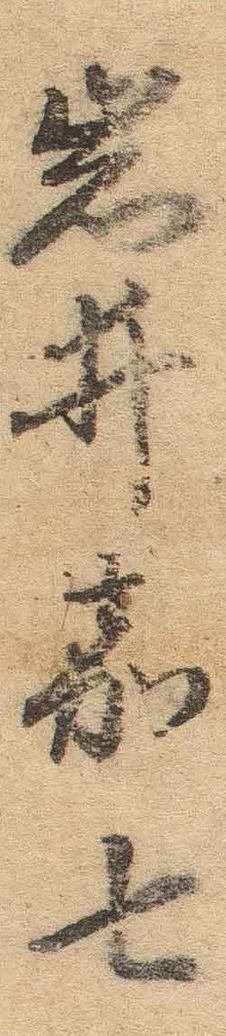岩井嘉七
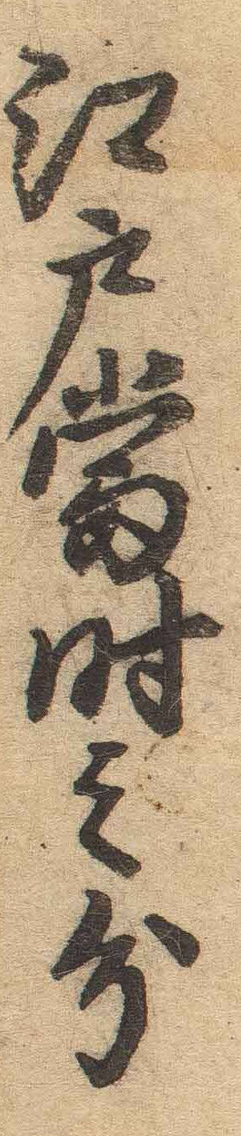江戸当時之分
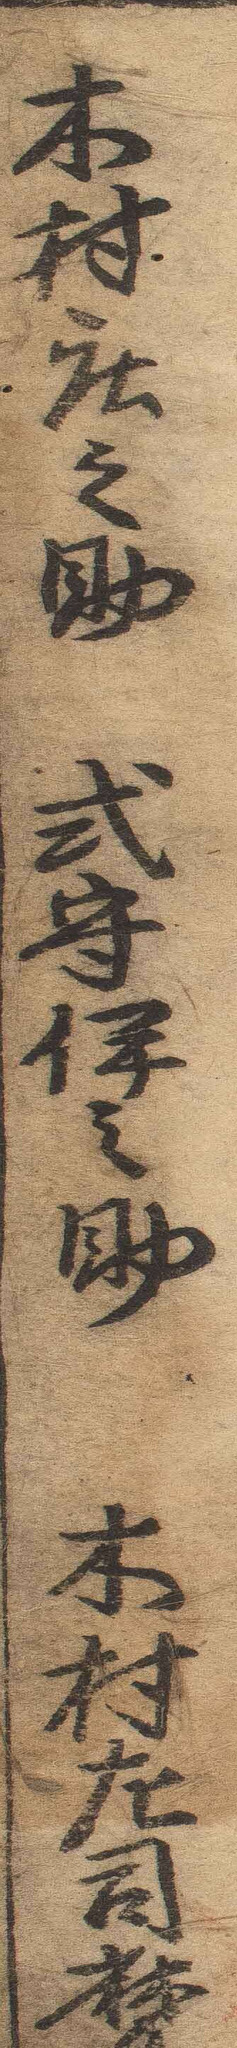木村庄之助式守伊之助木村左司禁
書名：古今相撲大全
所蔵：東京学芸大学附属図書館 国文学研究資料館
